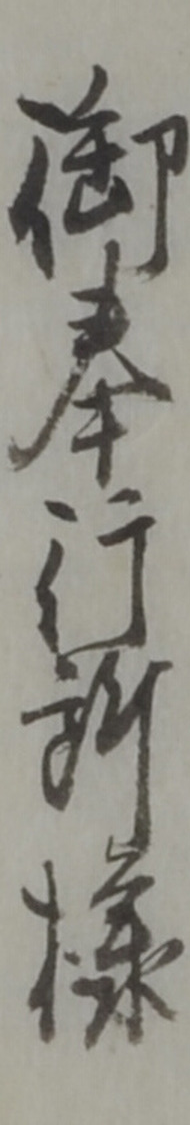御奉行所様
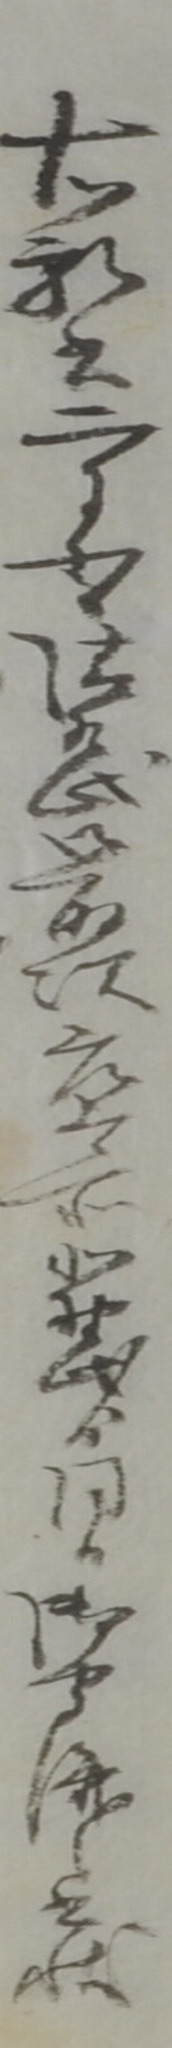右願書二月五日請取此御取次差上候所北野氏ゟ同日御聞済し書状
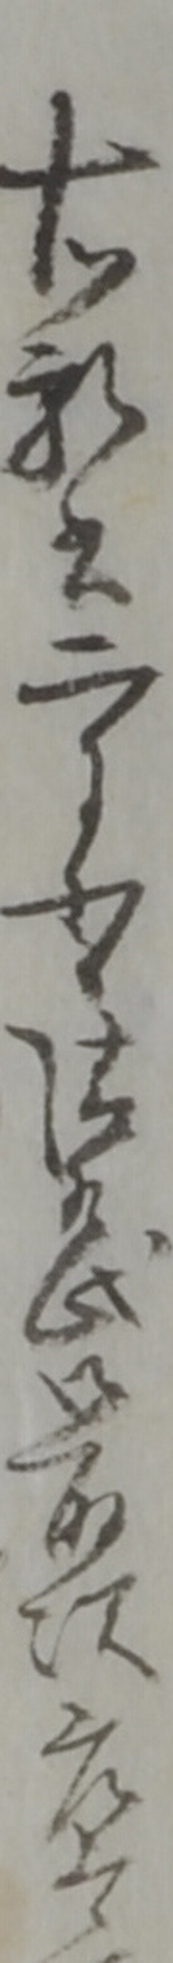右願書二月五日請取此御取次差上候所
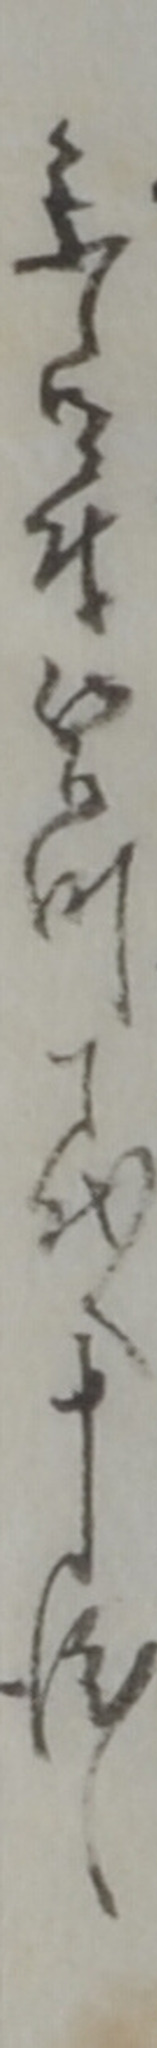参り候ニ付袋町丁代へ申渡候

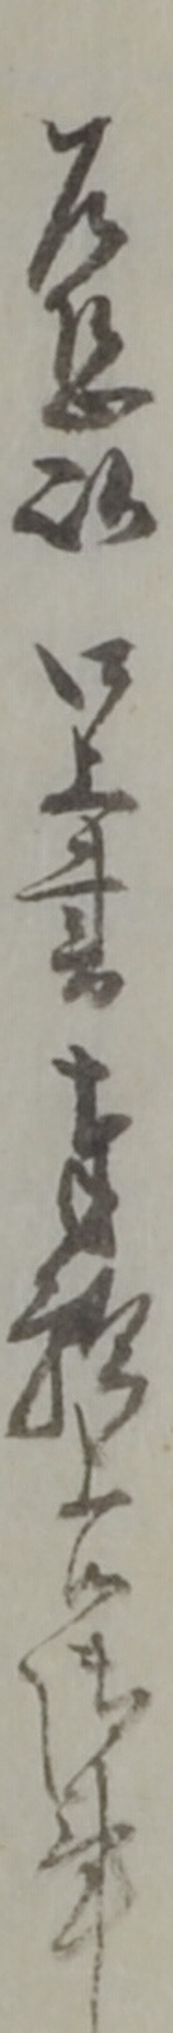乍恐以口上書奉願上候御事
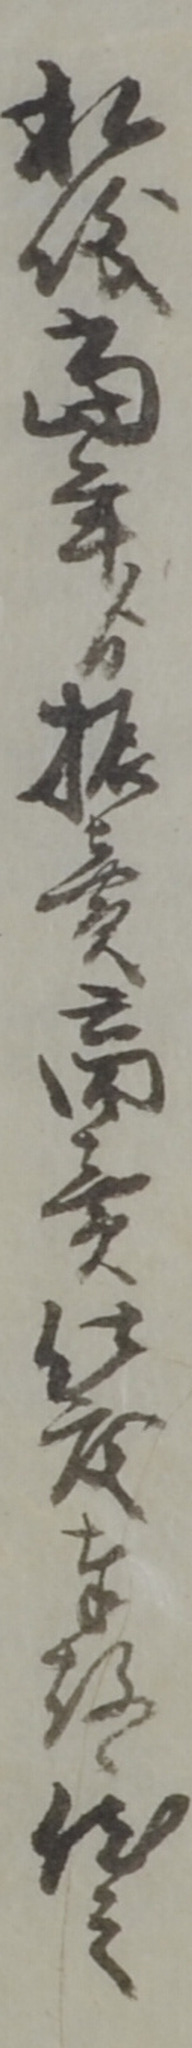私儀当年ゟ振売商売仕度奉存候依之
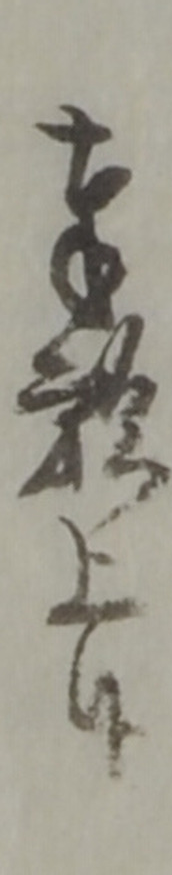奉願上候
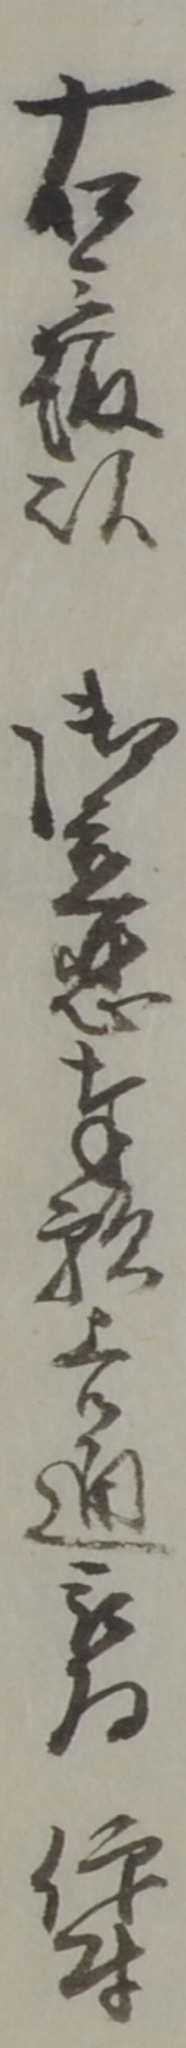右之趣以御慈悲奉願上之通被為仰付
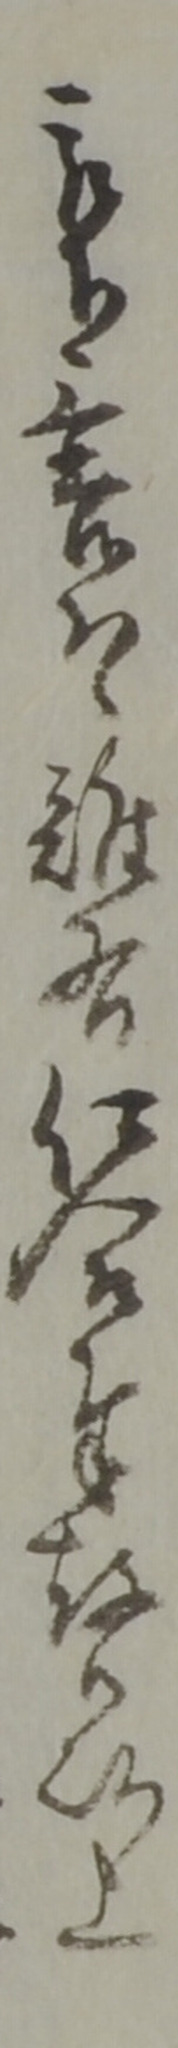被下置候ハヽ難有仕合奉存候以上
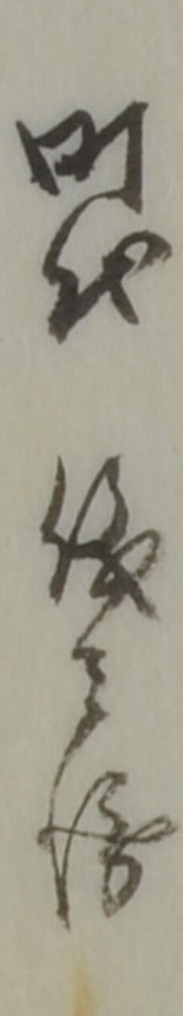町代儀兵衛
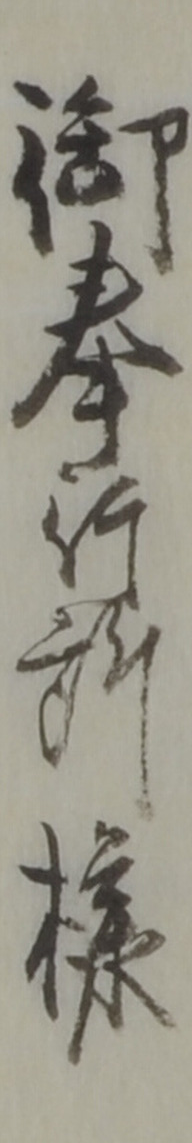御奉行所様
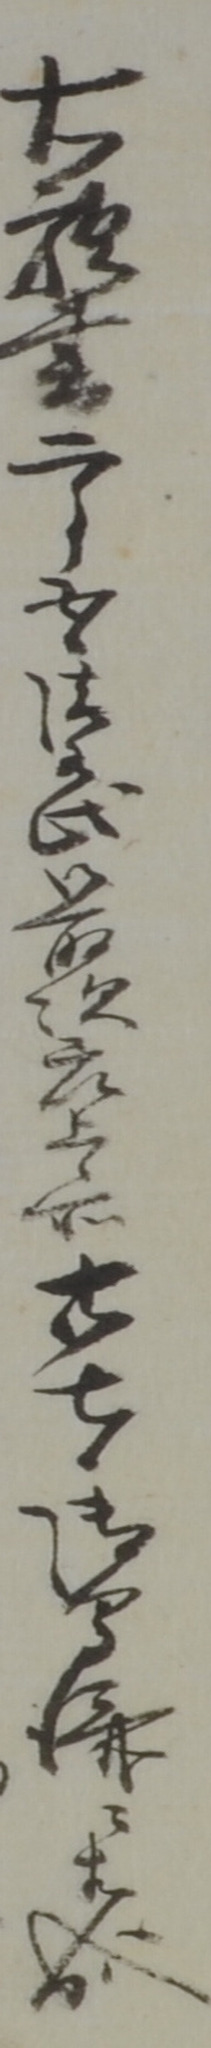右願書二月五日清水氏御取次差上候所廿七日御聞済ニ相成
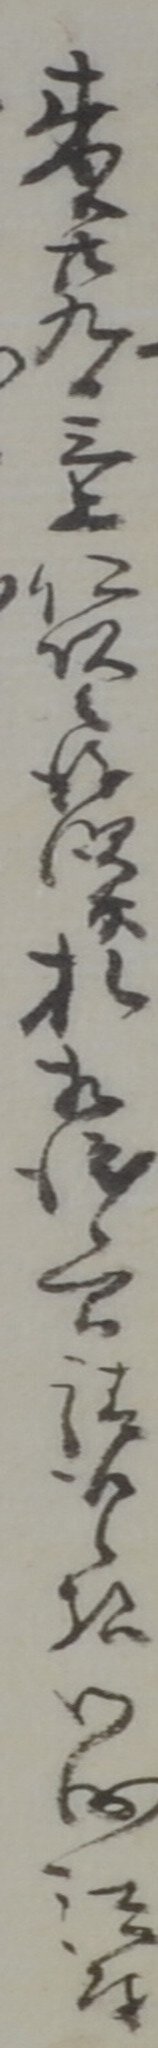来る廿九日三上仁次兵衛様江札相渡候間請取候様御沙汰ニ付
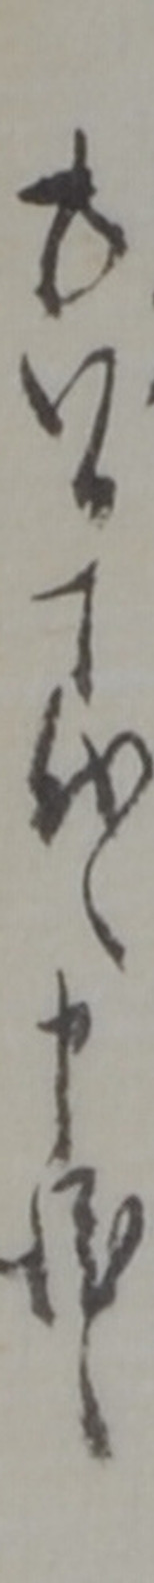廿八日丁代へ申渡候
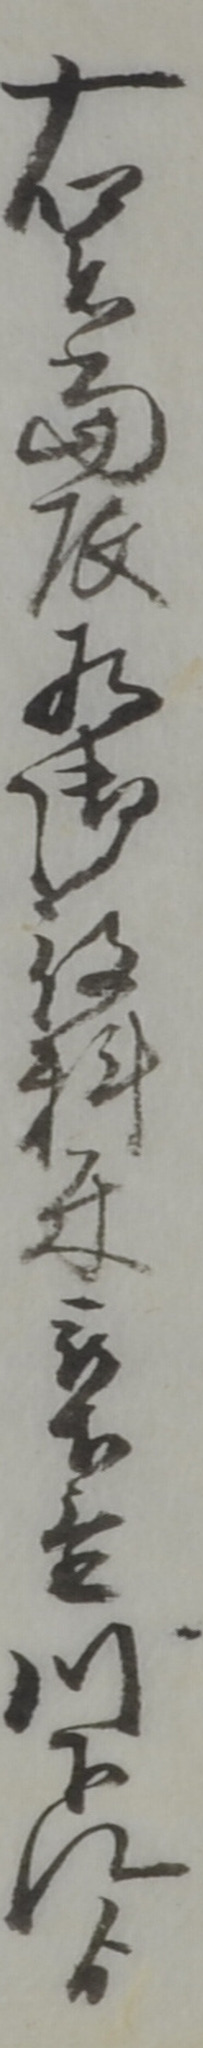右者当辰為御役料米被下置川下郷ゟ
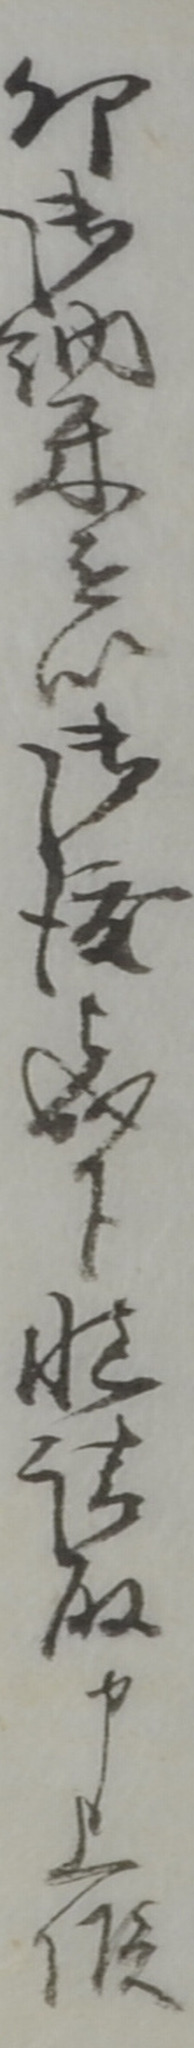卯御納米を以御渡被成下慥請取申上候
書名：諸願書控簿
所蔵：伊那市立高遠町図書館・合同会社AMANE
